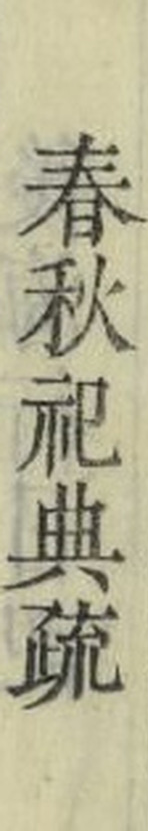春秋祀典疏
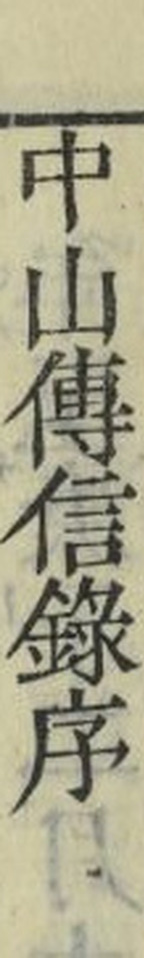中山傳信錄序

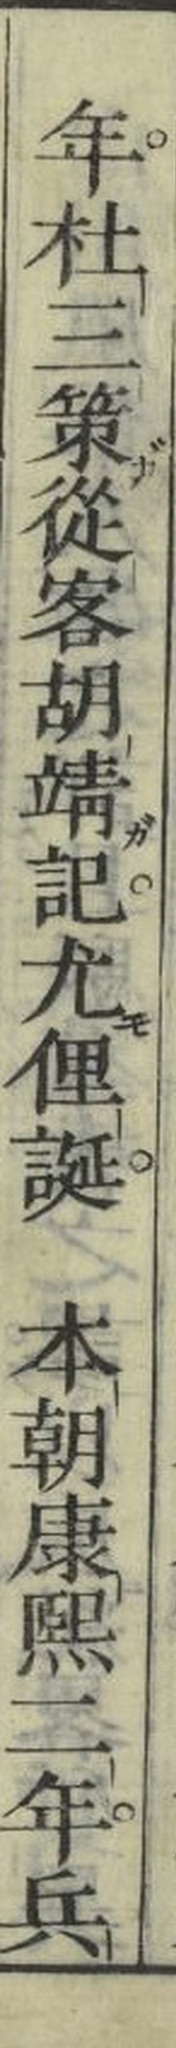年。杜-三策從-客胡-靖記。尤俚-誕。本-朝康-煕二-年。兵-

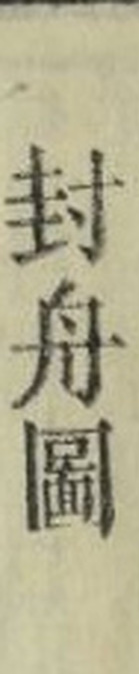封舟圖

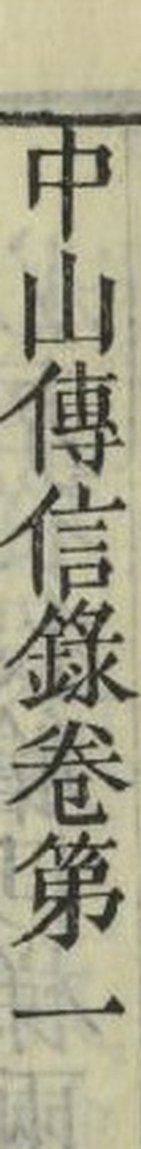中山傳信錄卷第一
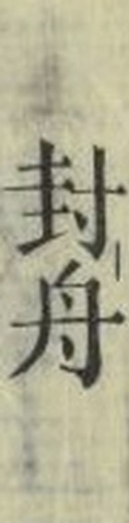封-舟
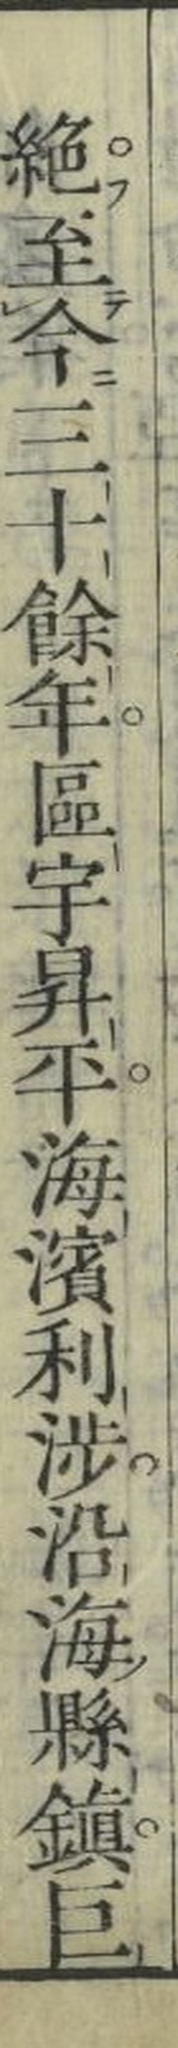絶。至今三-十-餘-年。區-宇昇-平。海-濱利-涉。沿-海縣-鎭。巨-

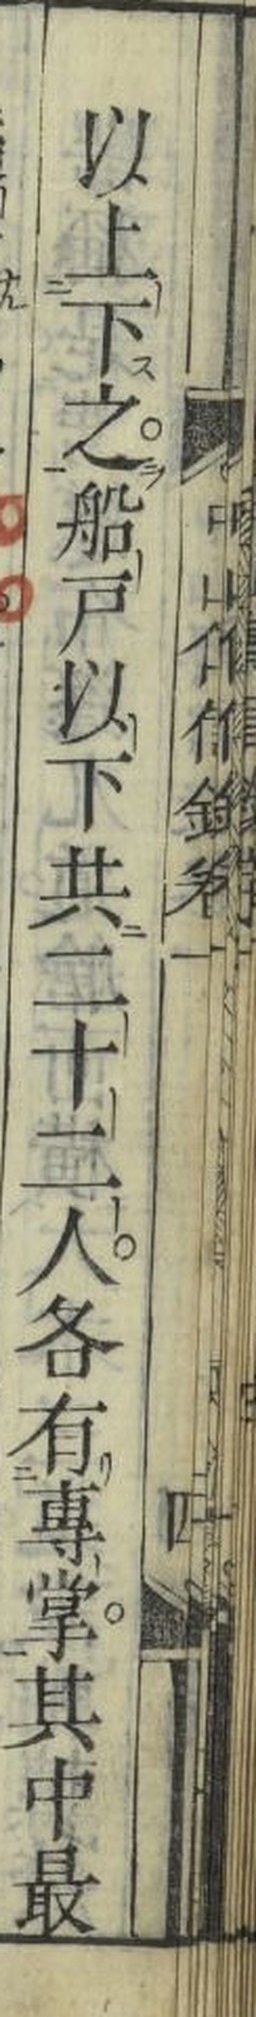以上-下之。船-戸以-下共二-十-二-人。各有專-掌。其中最

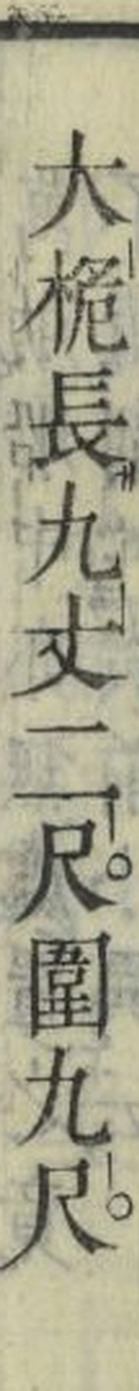大-桅長九-丈二-尺。圍九-尺。
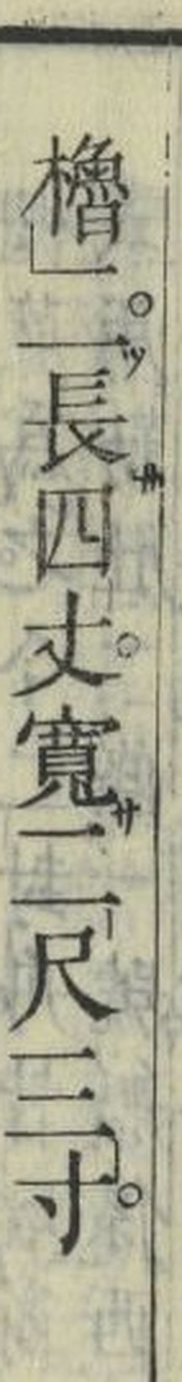櫓-二。長四-丈。寬二-尺三-寸。
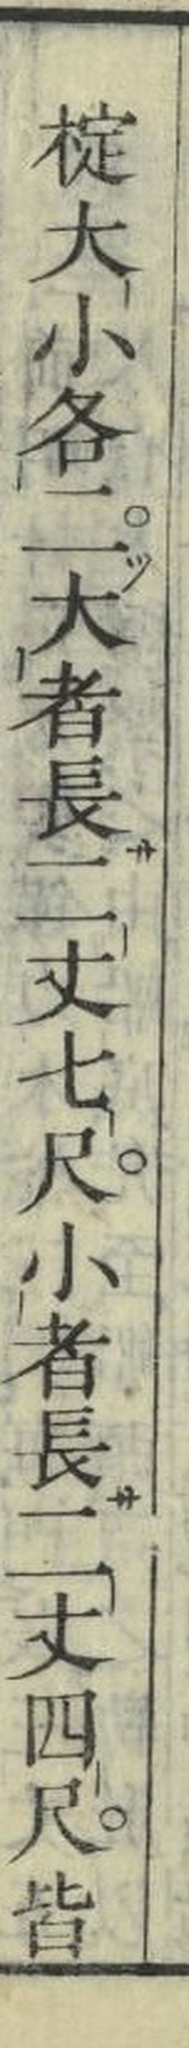椗大-小各-二。大-者長二-丈七-尺。小-者長二-丈四-尺。皆
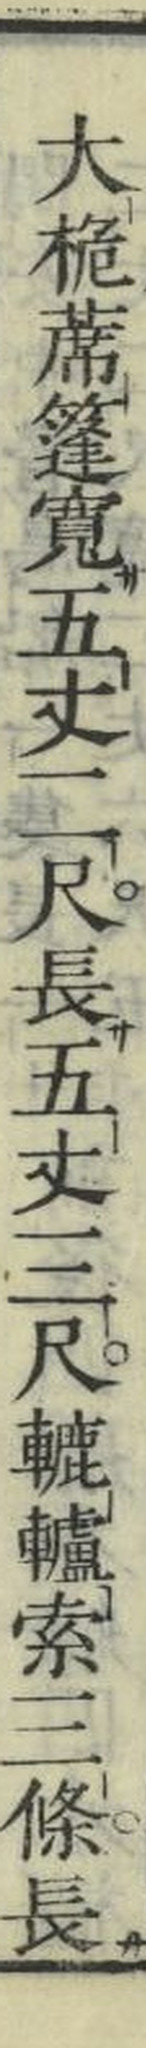大-桅蓆-篷寬五-丈二-尺。長五-丈三-尺。轆-轤-索三-條。長
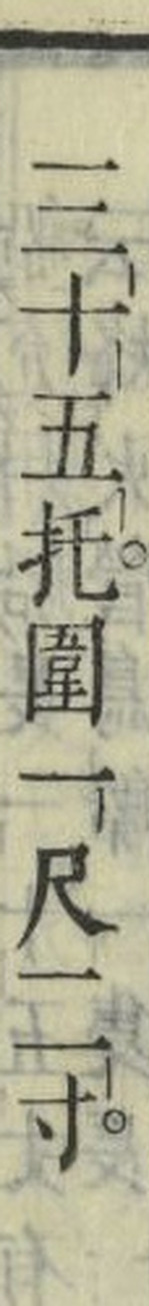三-十-五-托。圍一-尺二-寸。
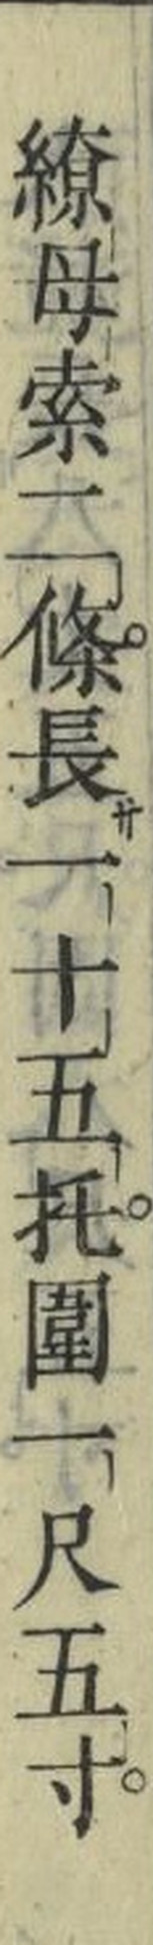繚-母-索二-條。長一-十-五-托。圍一-尺五-寸。
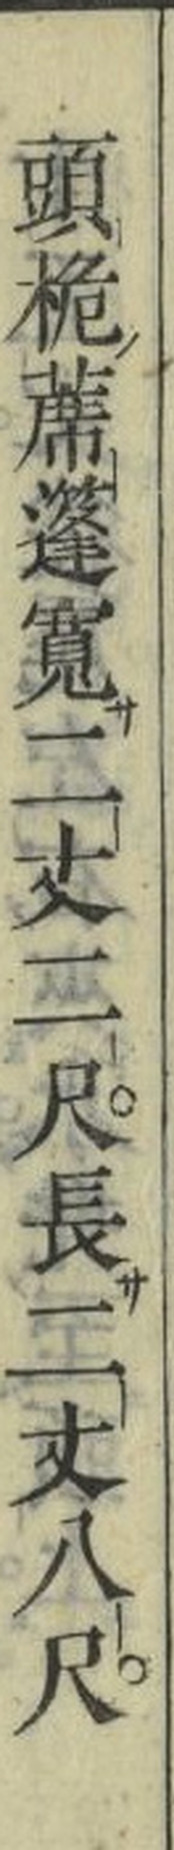頭-桅蓆-篷寬二-丈二-尺。長二-丈八-尺。
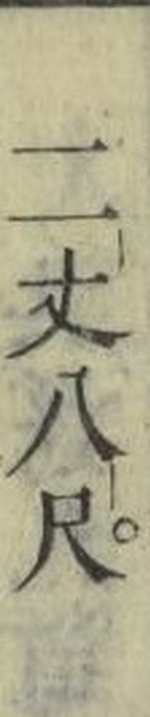二-丈八-尺。
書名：中山伝信録 巻一
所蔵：University of the Ryukyus Library
